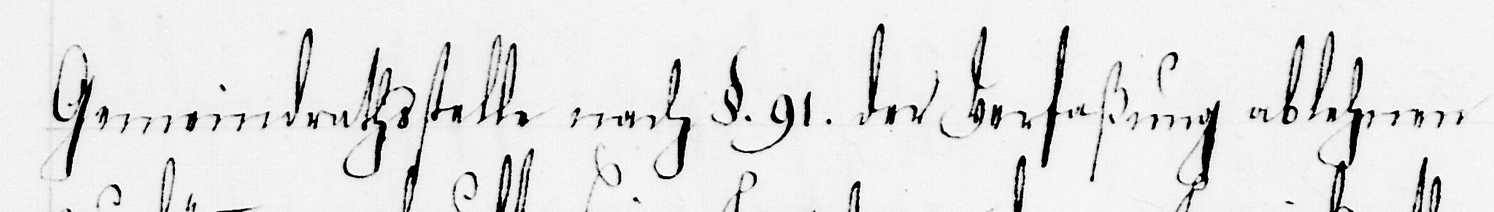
Gemeindrathsstelle nach §. 91. der Verfaßung ablehnen
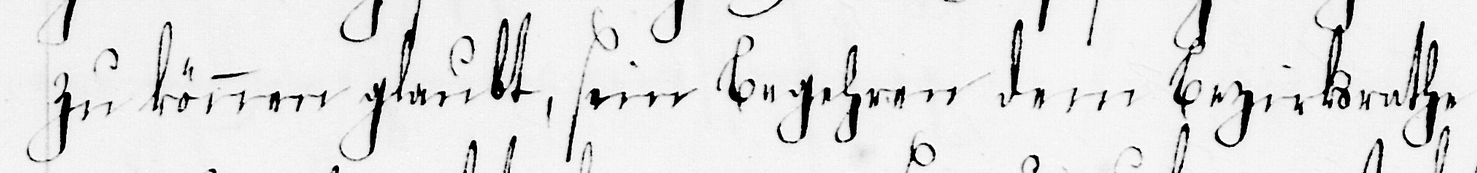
zu können glaubt, sein Begehren dem Bezirksrathe
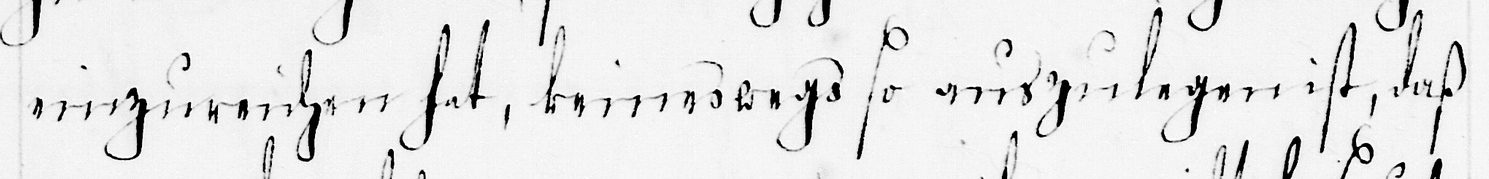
einzureichen hat, keineswegs so auszulegen ist, daß
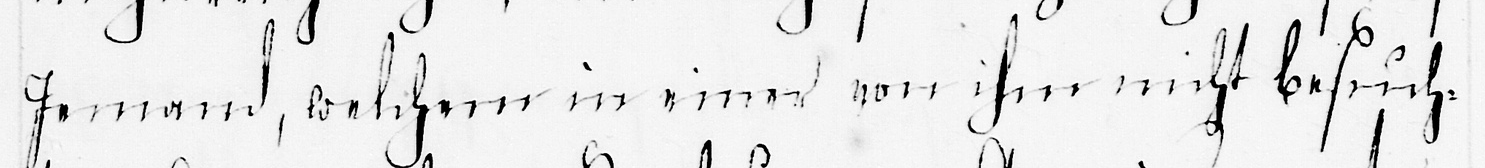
Jemand, welchem in einer von ihm nicht besuch¬
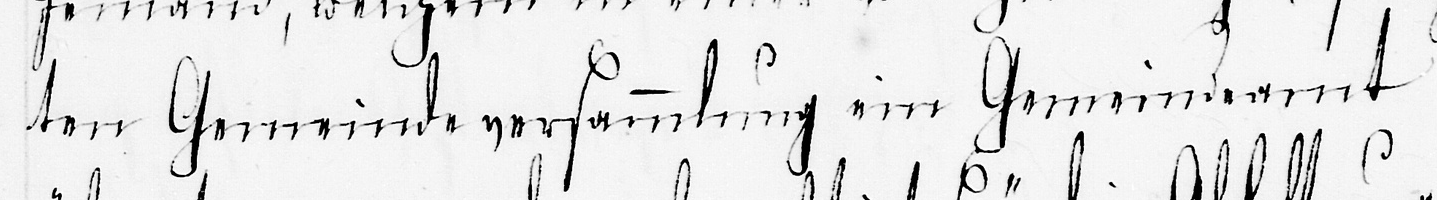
ten Gemeindeversammlung ein Gemeindeamt
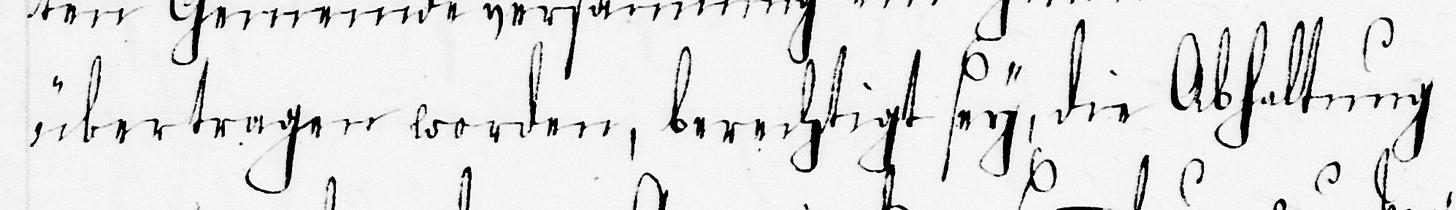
übertragen worden, berechtigt sey, die Abhaltung
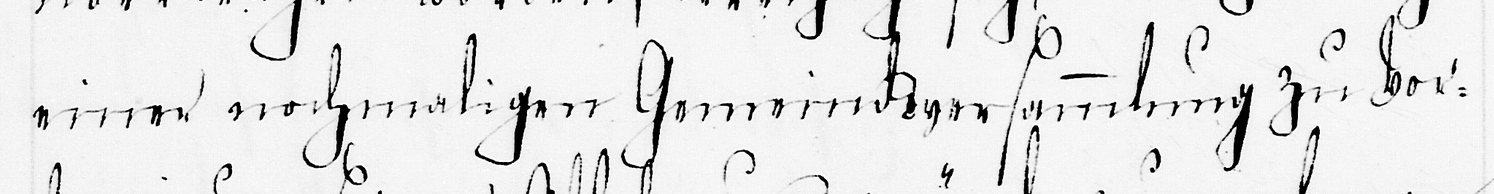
einer nochmaligen Gemeindsversammlung zu Vor¬
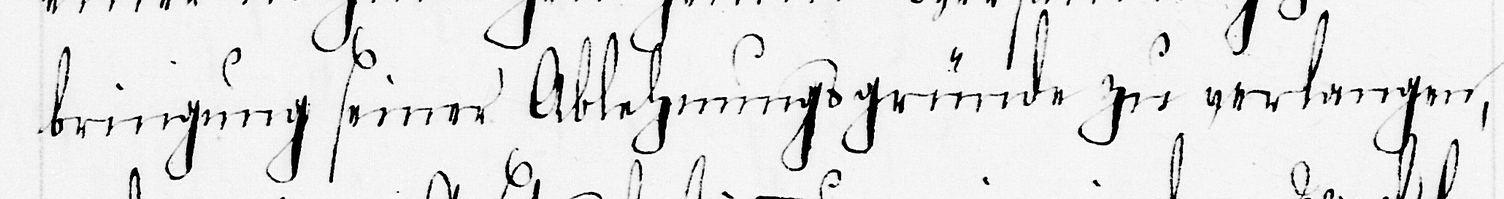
bringung seiner Ablehnungsgründe zu verlangen,
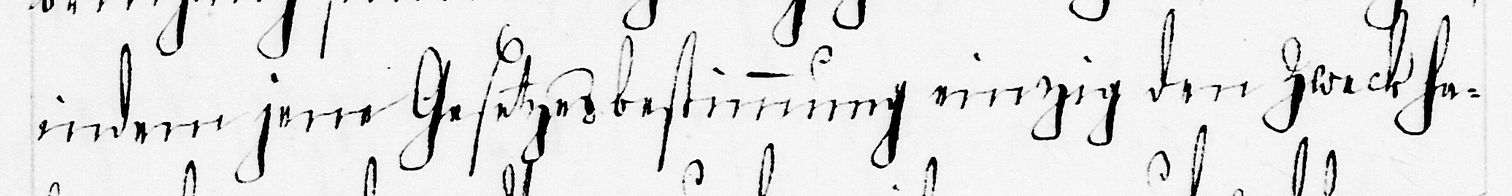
indem jene Gesetzesbestimmung einzig den Zweck ha¬
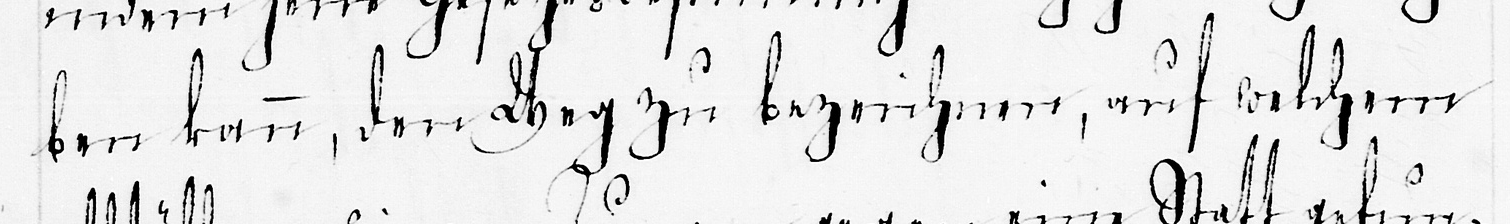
ben kann, den Weg zu bezeichnen, auf welchem
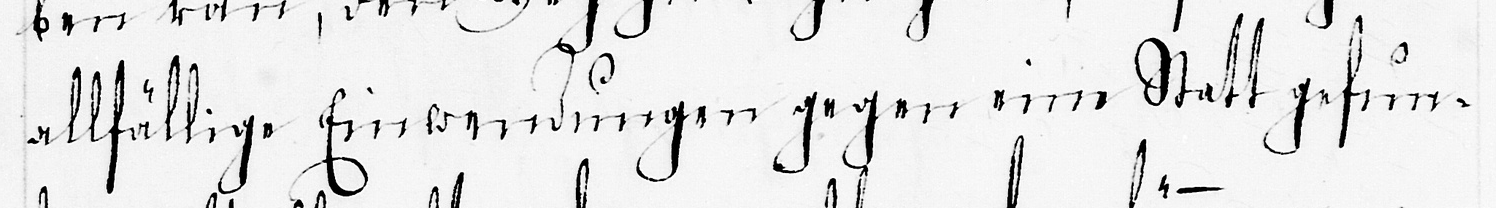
allfällige Einwendungen gegen eine Statt gefun¬
